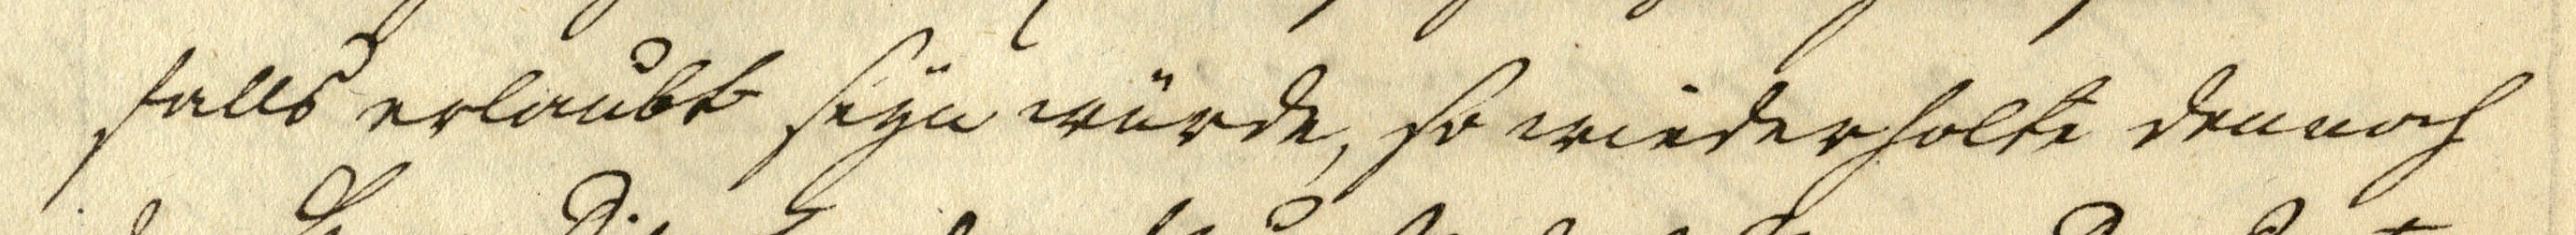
falls erlaubt seyn würde, so wiederholte dennoch
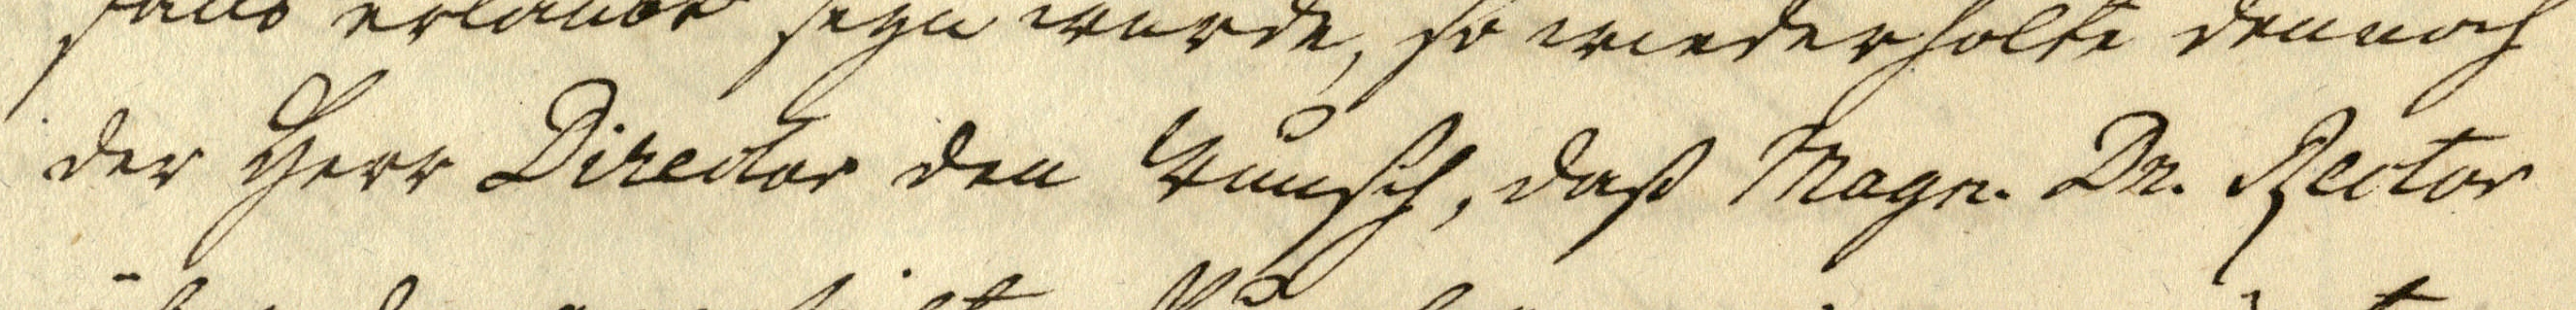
der Herr Director den Wunsch, daß Magn. Dn. Rector
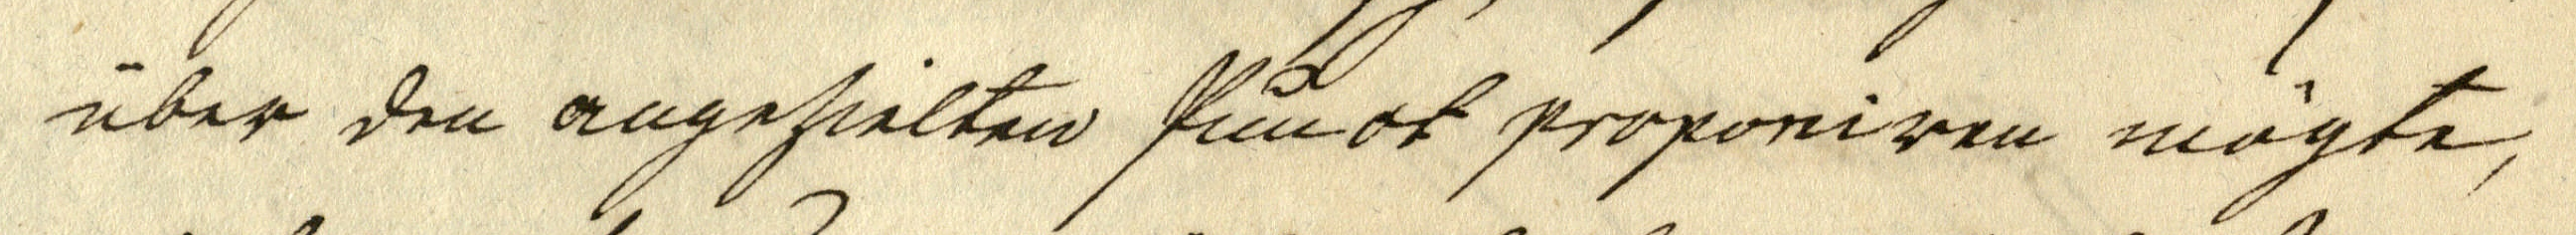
über den angezielten Punct proponiren mögte,
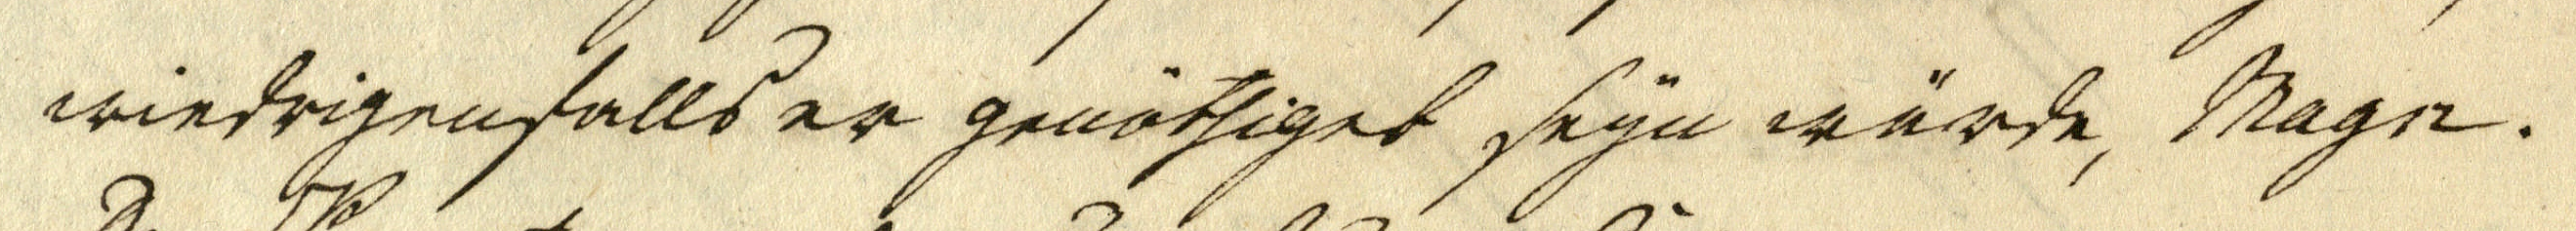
wiedrigenfalls er genöthiget seyn würde, Magn.
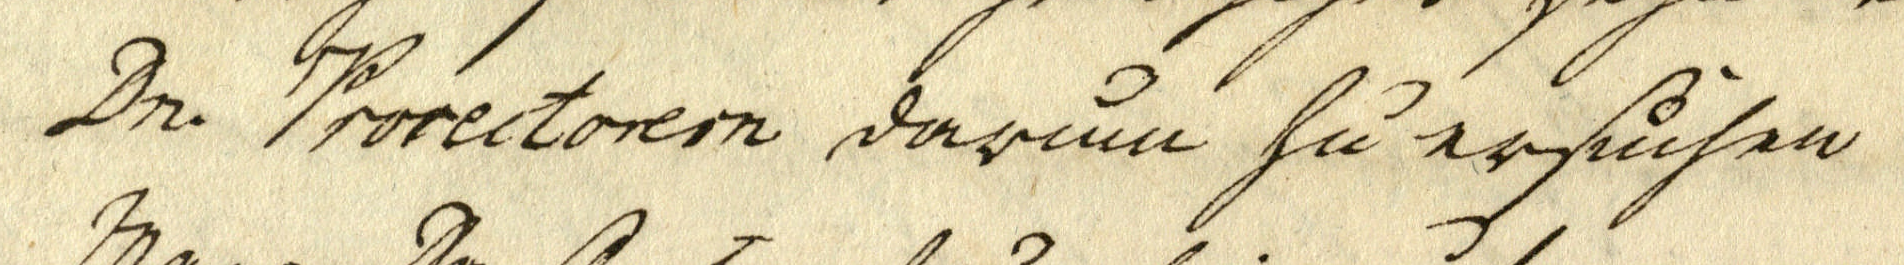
Dn. Prorectorem darum zu ersuchen.
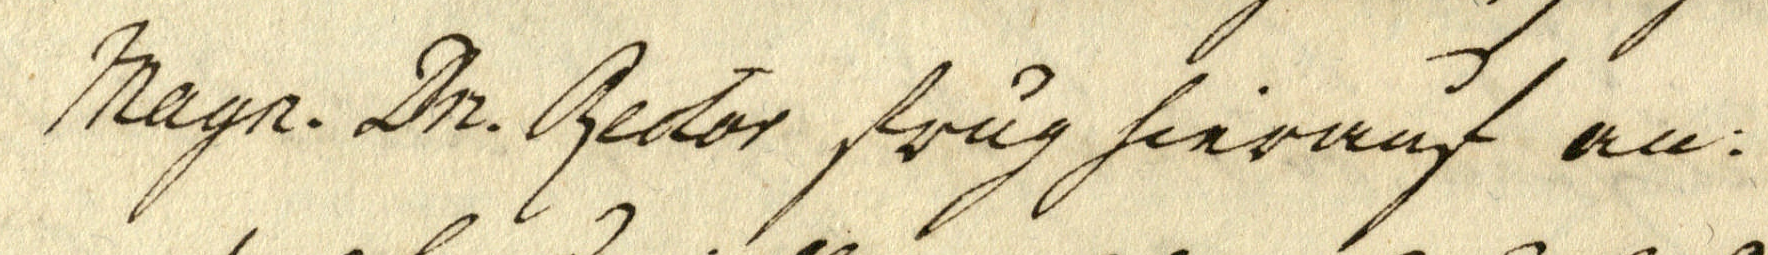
Magn. Dn. Rector frug hierauf an:
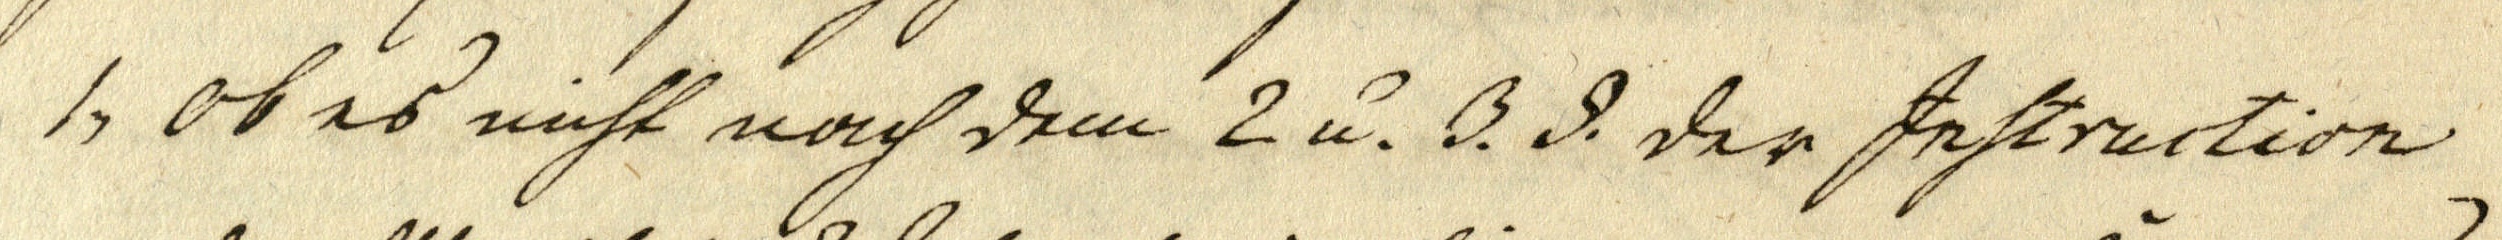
1., ob es nicht nach dem 2 u. 3. § der Instruction
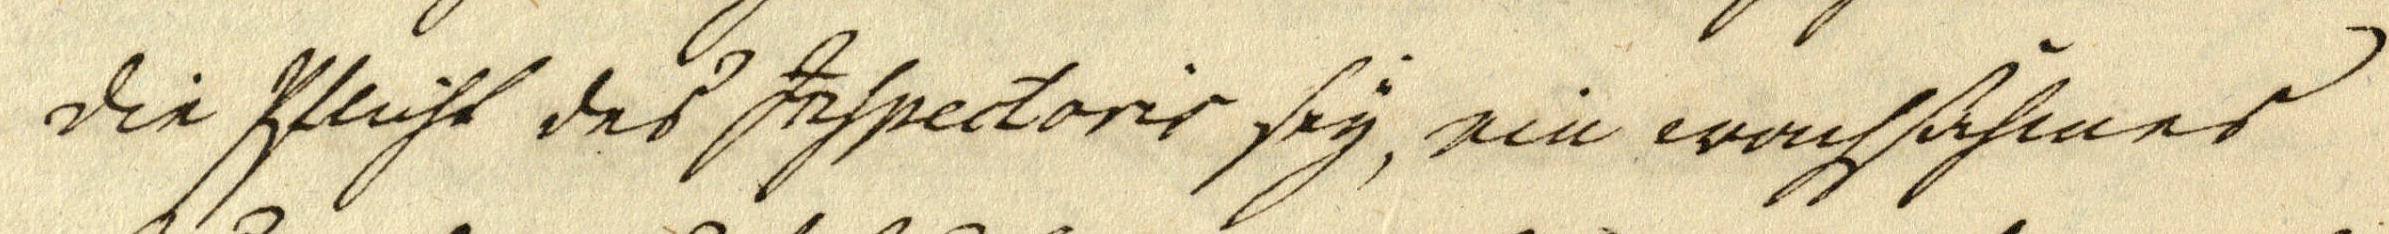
die Pflicht des Inspectoris sey, ein wachsahmes
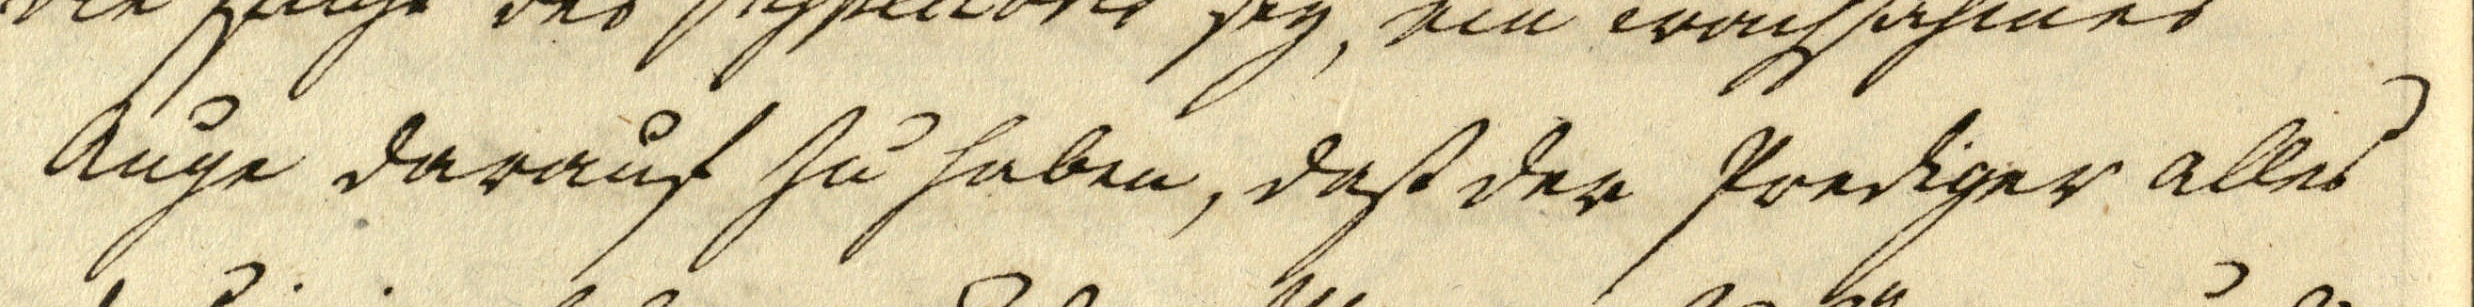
Auge darauf zu haben, daß der Prediger alles
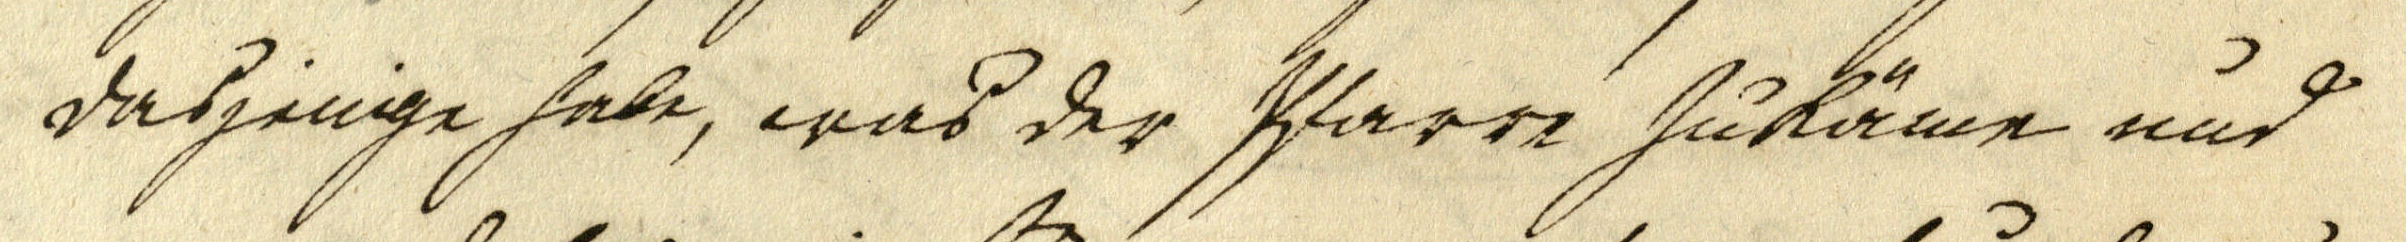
dasjenige habe, was der Pfarre zukäme und
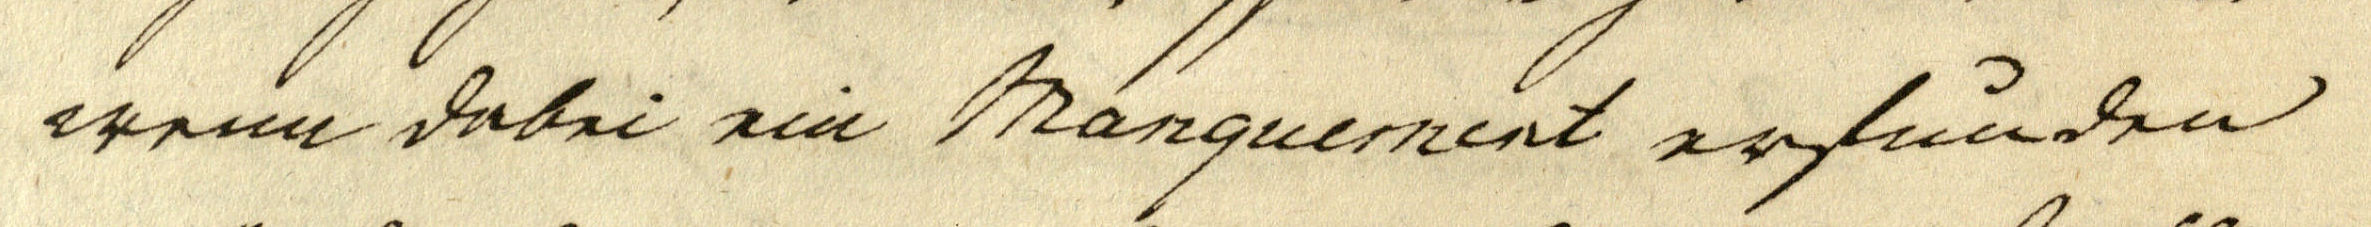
wenn dabei ein Manquement erfunden
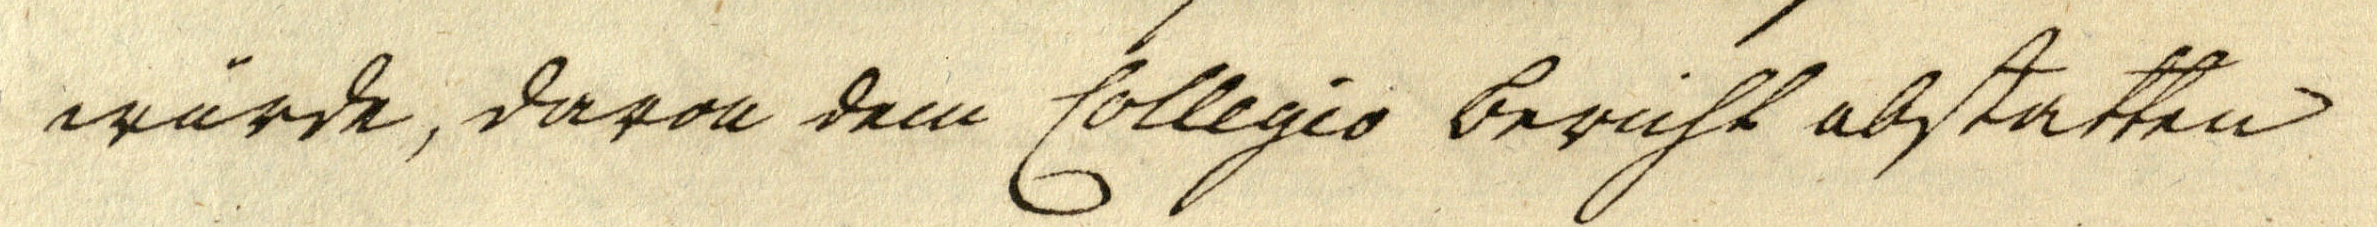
würde, davon dem Collegio Bericht abstatten
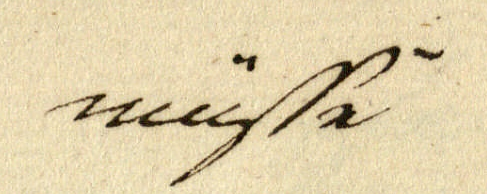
müsse
